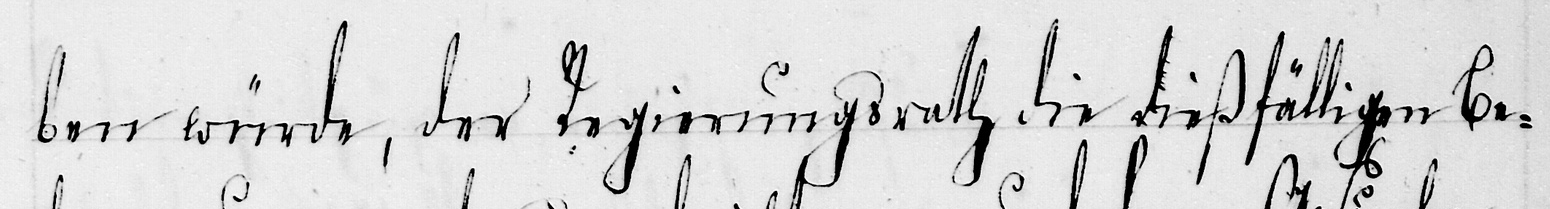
ben würde, der Regierungsrath die dießfälligen Be¬
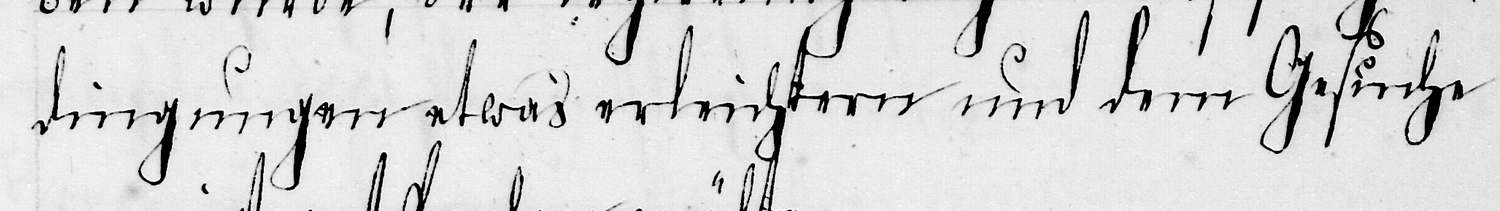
dingungen etwas erleichtern und dem Gesuche
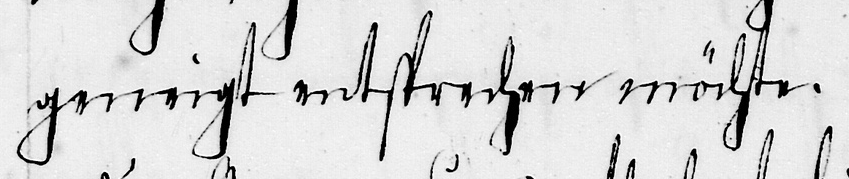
geneigt entsprechen möchte.
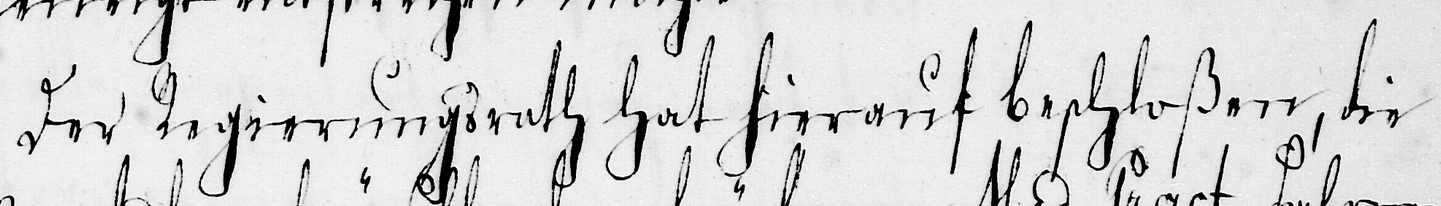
Der Regierungsrath hat hierauf beschloßen, die
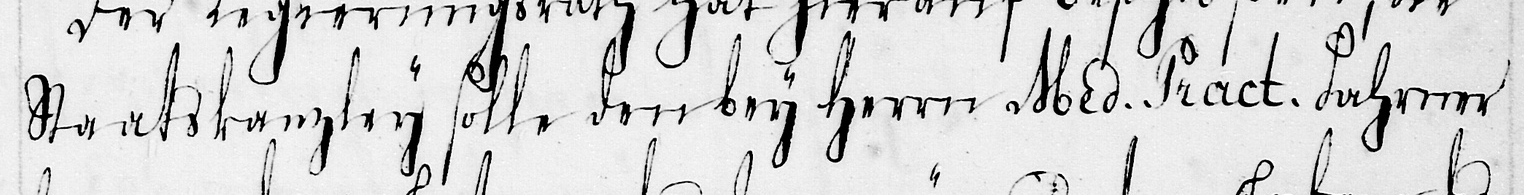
Staatskanzley solle den bey Herrn Med. Pract. Fahrner
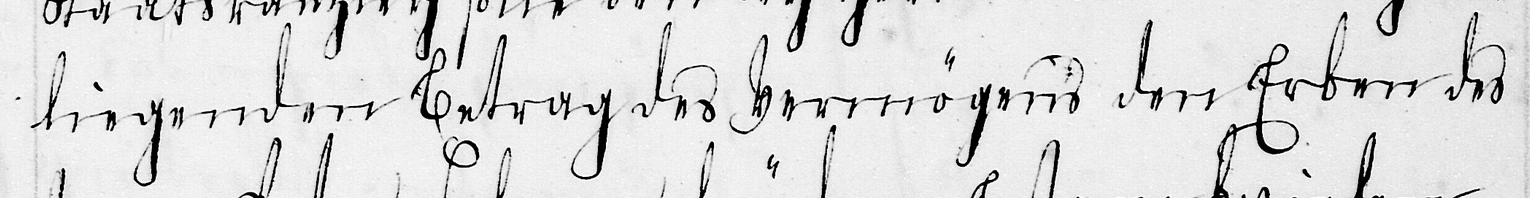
liegenden Betrag des Vermögens den Erben des
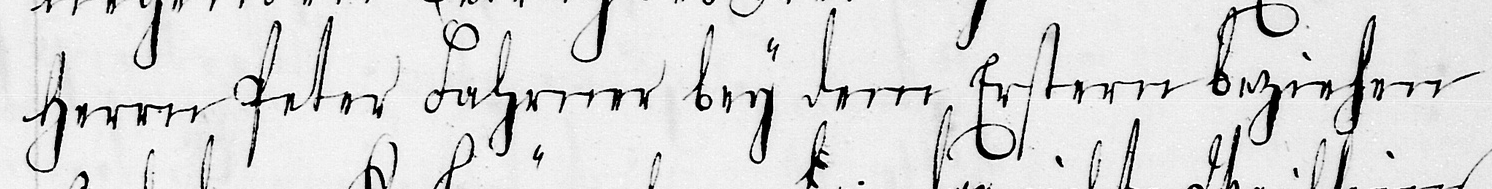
Herrn Peter Fahrner bey dem Erstern beziehen
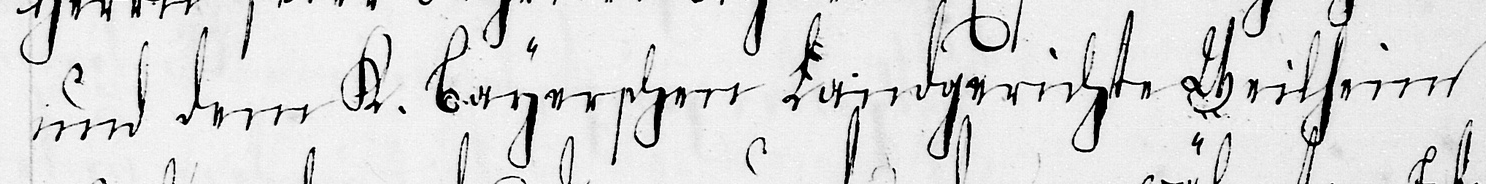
und dem K. Bayerschen Landgerichte Weilheim
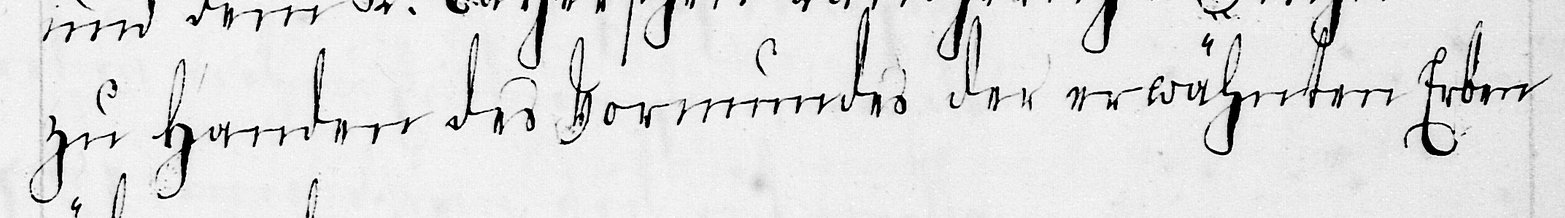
zu Handen des Vormundes der erwähnten Erben
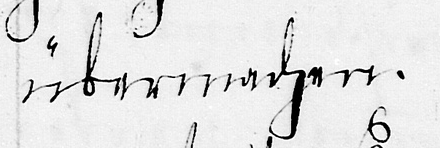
übermachen.
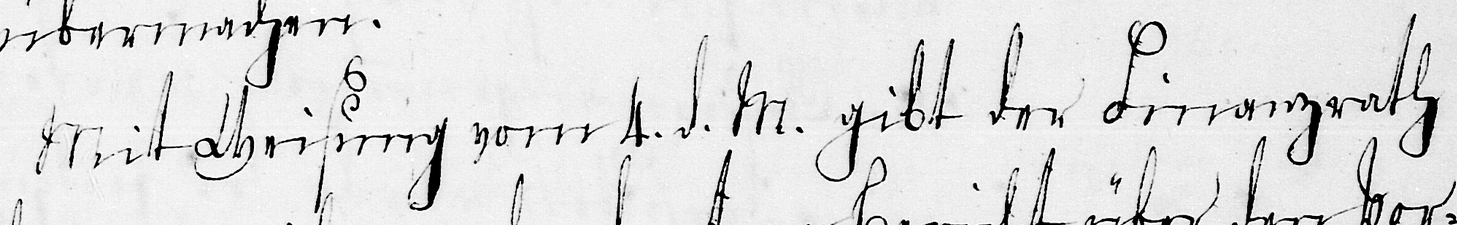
Mit Weisung vom 4. d. M. gibt der Finanzrath
